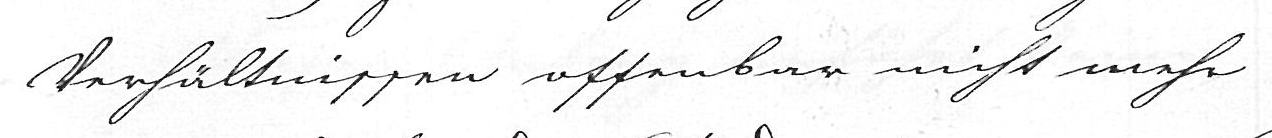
Verhältnissen offenbar nicht mehr
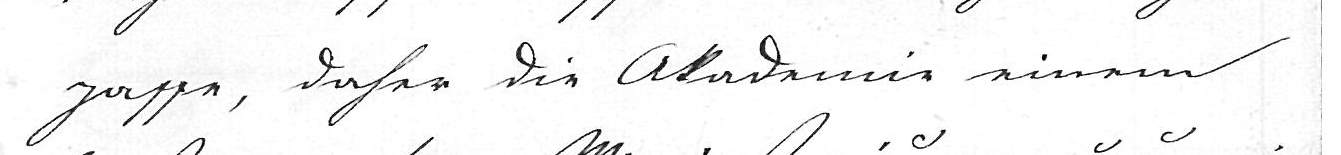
passe, daher die Akademie einem
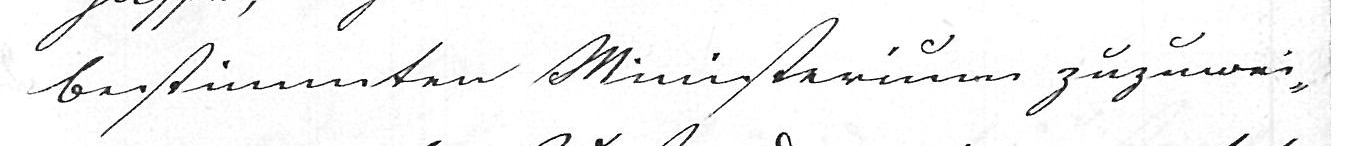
bestimmte Ministerium zuzuwei-
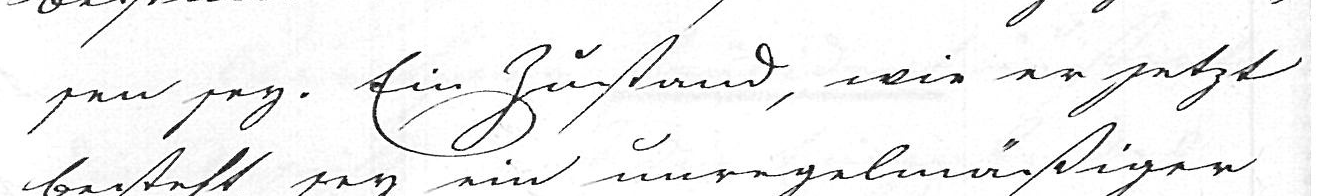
sen sey. Ein Zustand, wie er jetzt
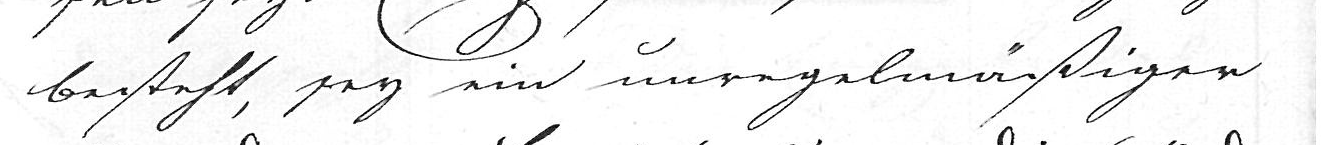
besteht, sey ein unregelmäßiger
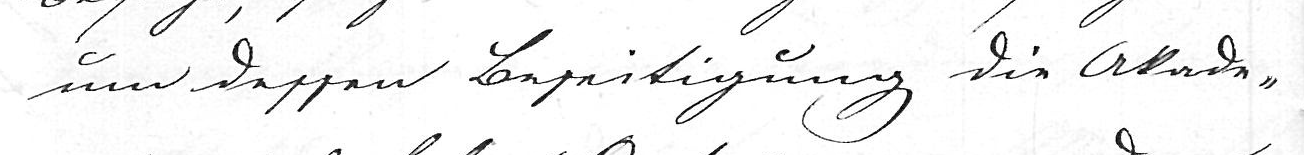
um dessen Beseitigung die Akade-
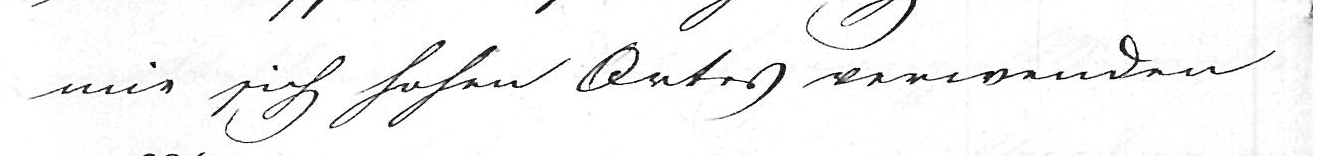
mie sich hohen Ortes verwenden
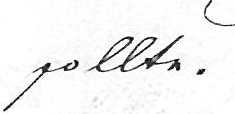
sollte.
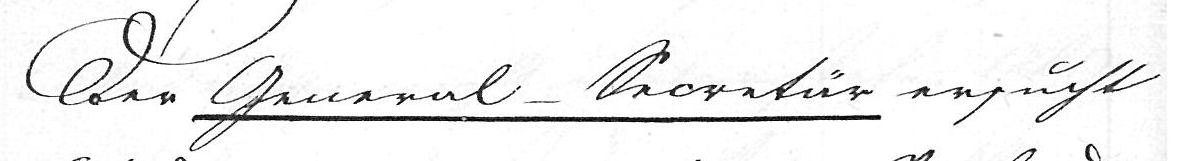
Der General-Secretär ersucht
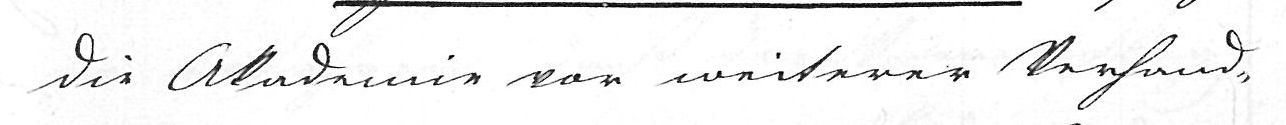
die Akademie vor weiterer Verhand-
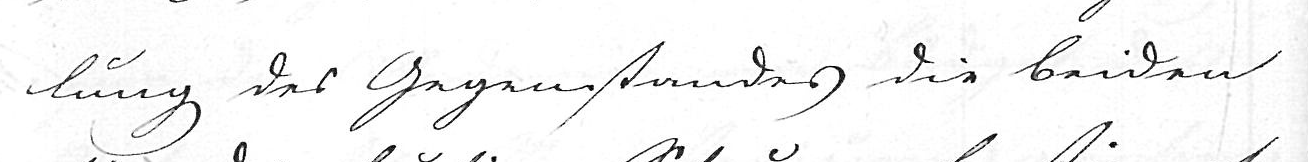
lung des Gegenstandes die beiden
